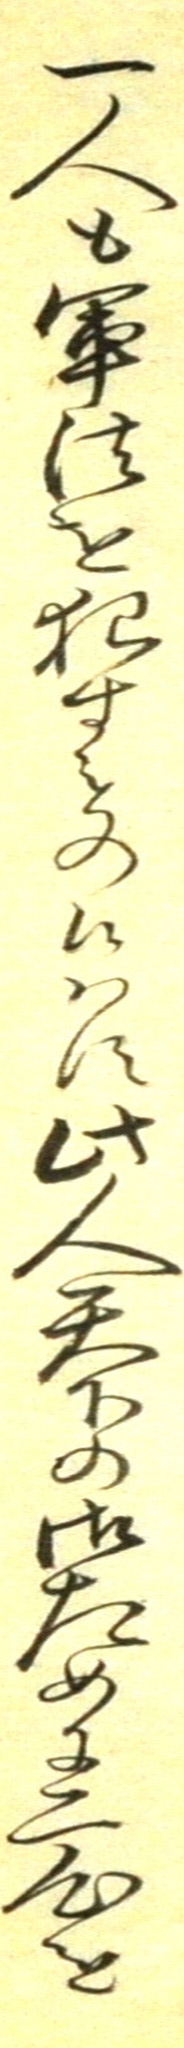一人も軍法を犯すもの候ハす此人天下の御ために二心を
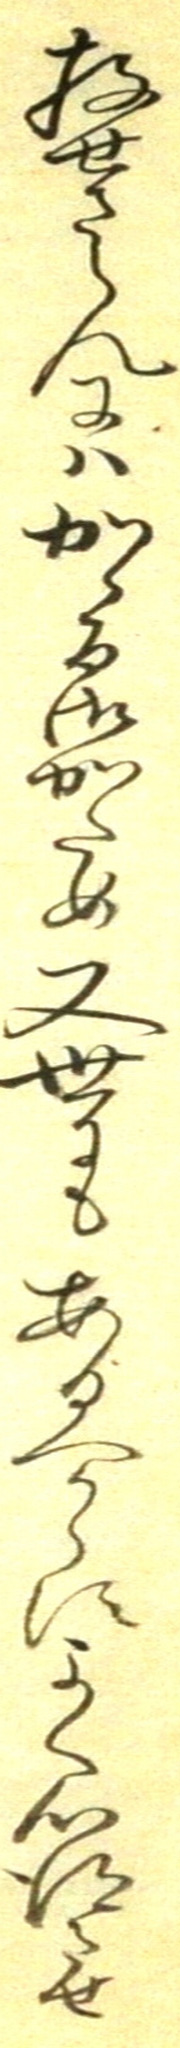存せさらんにハかゝる御かため又世にもあるへからすよく心得させ
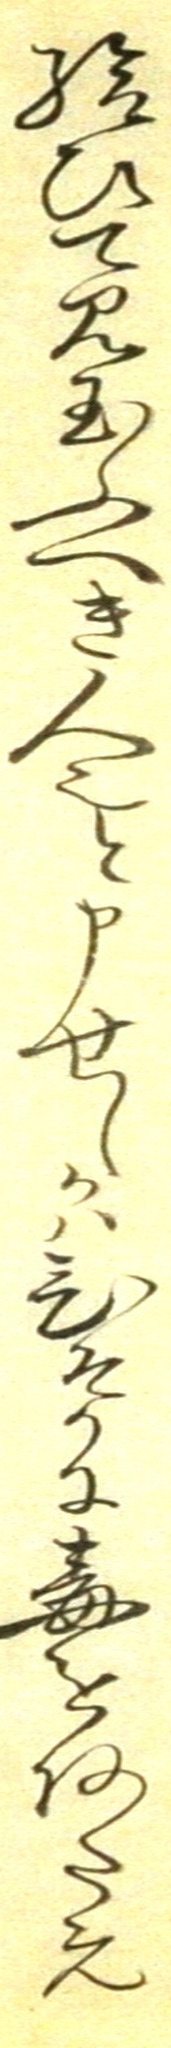給ひて見玉ふへき人也と申せしかハひそかに毒をあたえ
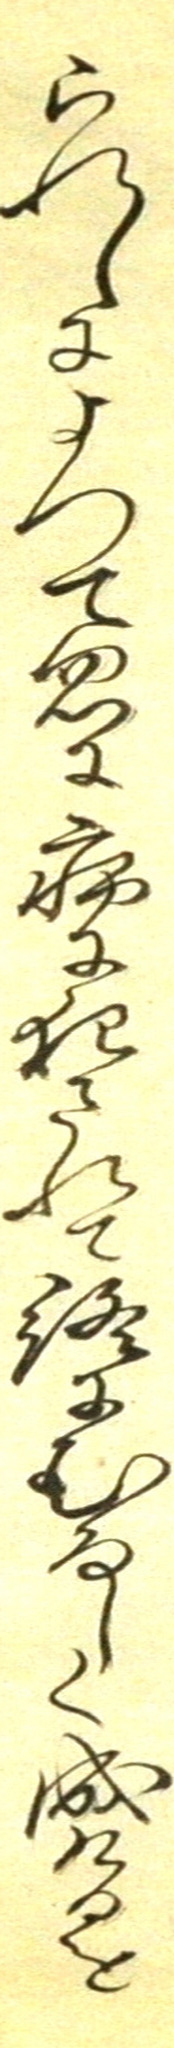られしによつて思に病に犯されて終にむなしく成けるを
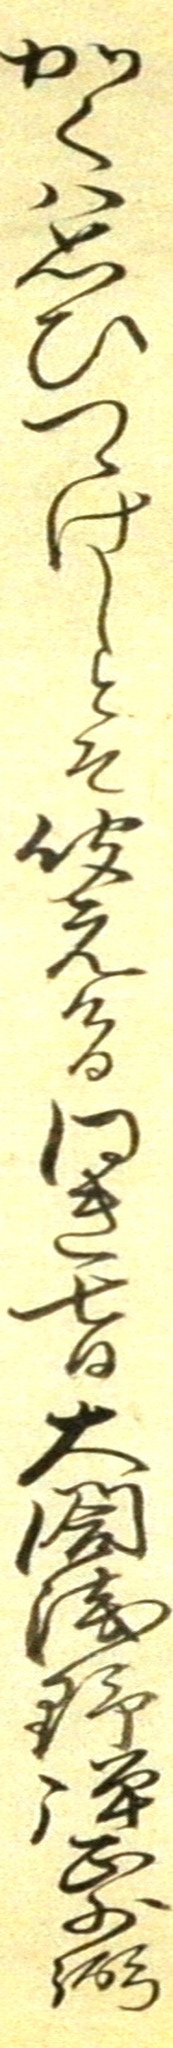かくハ思ひつゝけしとそ聞えける同き七日太閤浅野弾少弼
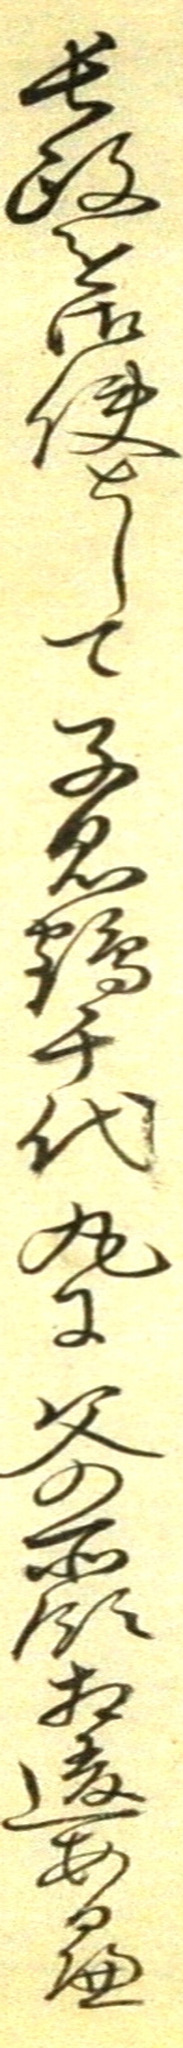長政を御使として子息鶴千代丸に父の所領相違あるへ
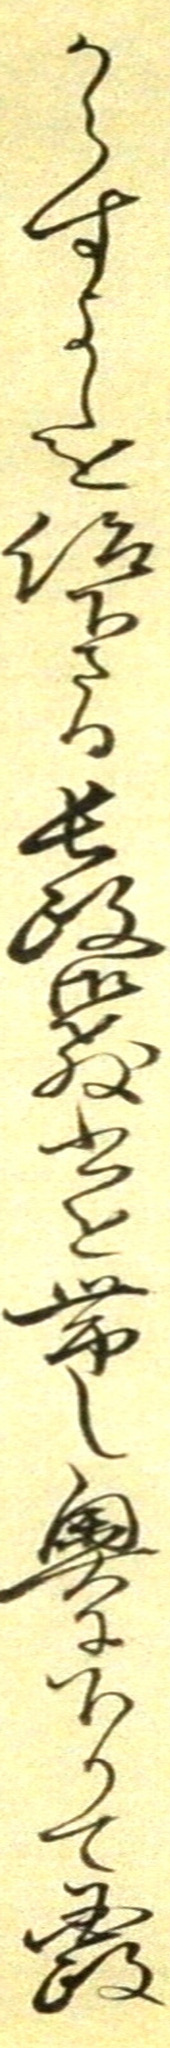からすよしを仰下さる長政御教書を帯し奥に下りて国政
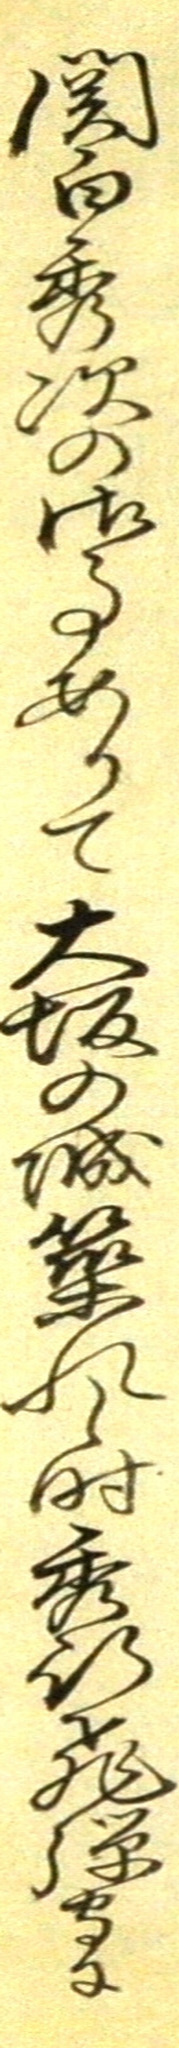関白秀次の御事ありて大坂の城築れし時秀行飛騨守に
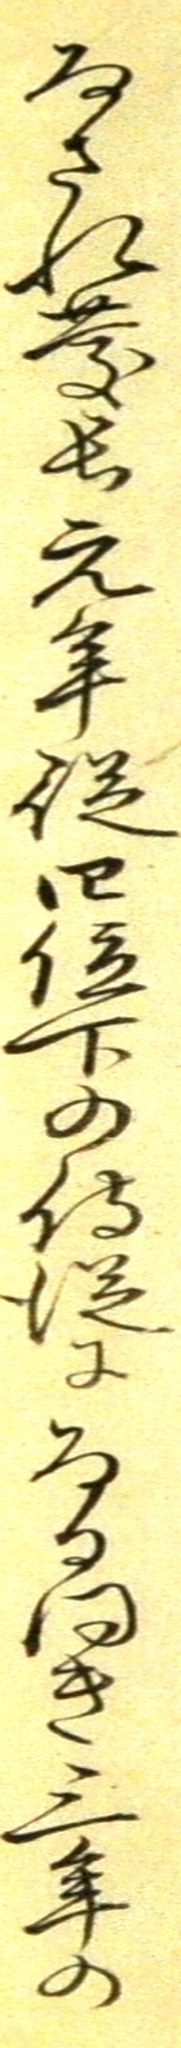なされ慶長元年従四位下の侍従になる同き三年の

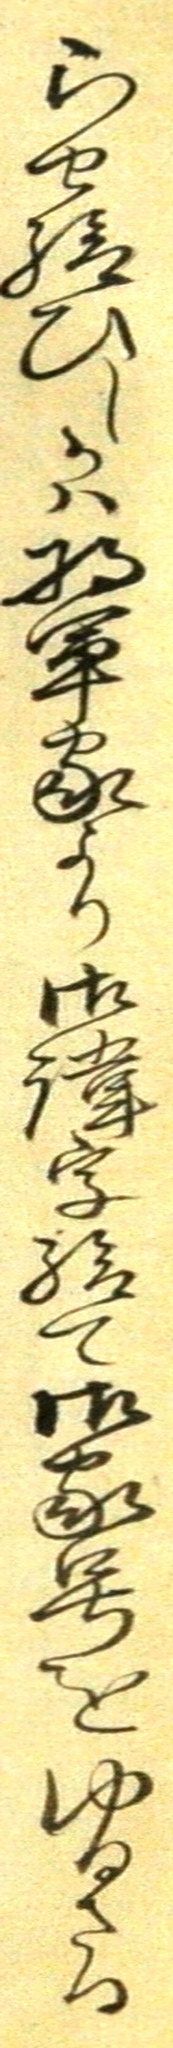らせ給ひしかハ将軍家より御諱字給て御家号をゆるさる
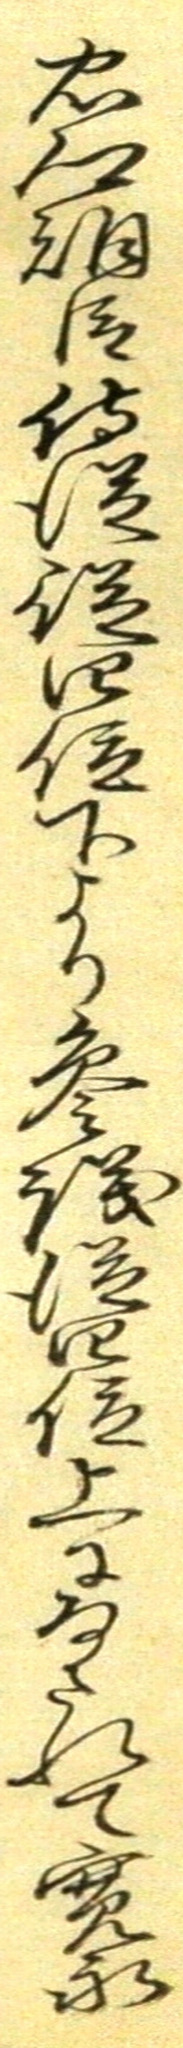忠郷朝臣侍従従四位下より参議従四位上になされて寛永
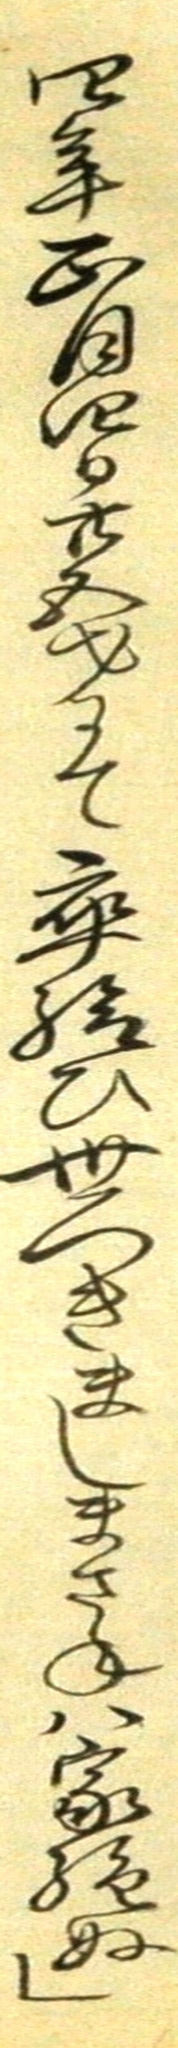四年正月四日廿五さい才にて卒給ひ世つきましまさねハ家絶ぬ」
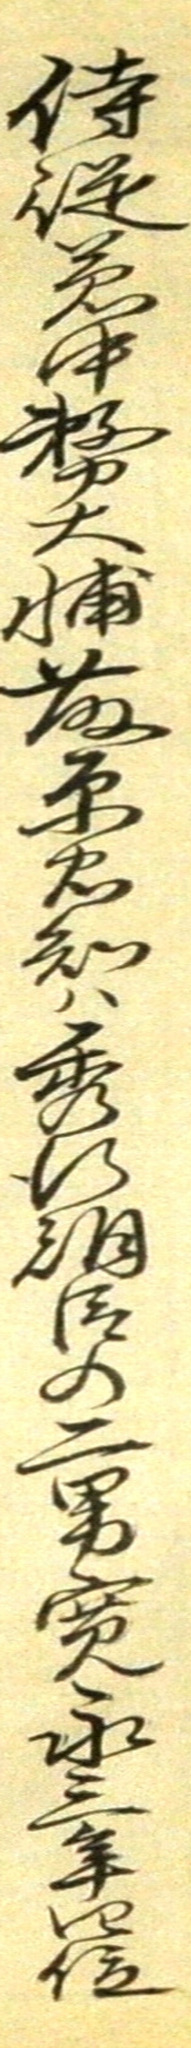侍従兼中務大輔藤原忠知ハ秀行朝臣の二男寛永三年四位
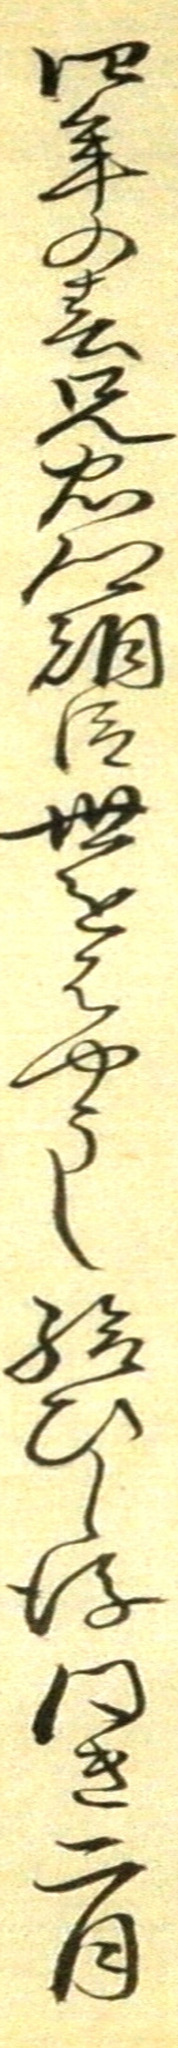四年の春兄忠郷朝臣世をはやうし給ひし後同き二月
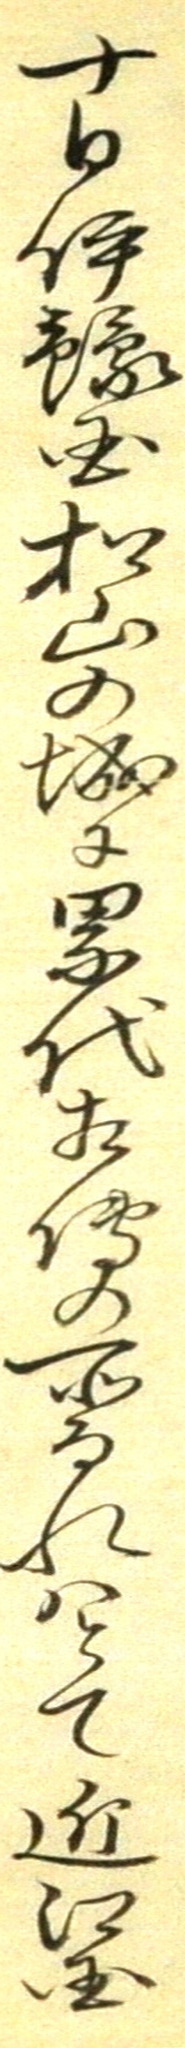十日伊代国松山の城に累代相伝の所なれハとて近江国
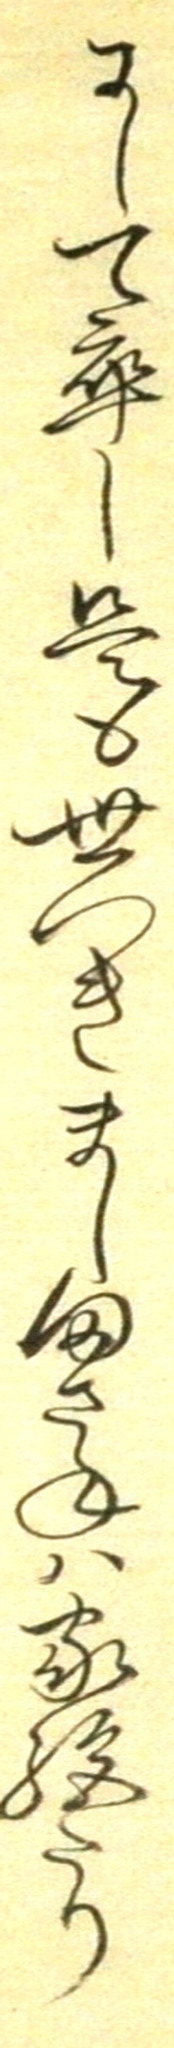にして卒し是も世つきましまさねハ家絶たり
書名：藩翰譜（十二・上）
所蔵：伊那市立高遠町図書館・合同会社AMANE
